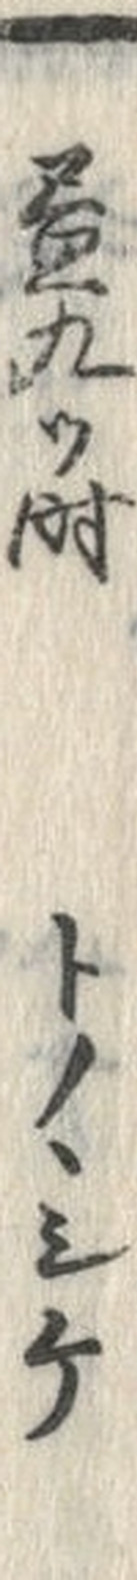昼九ツ時トノヽシケ
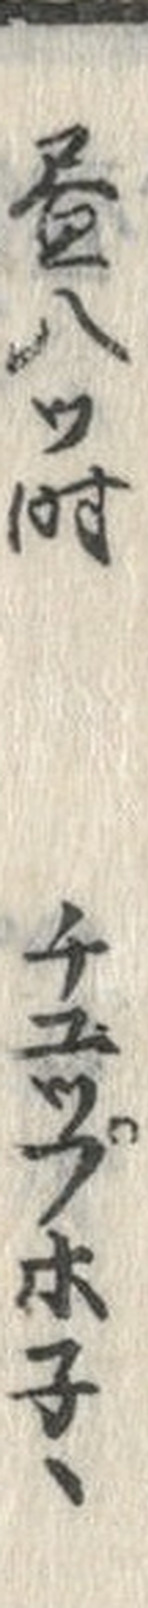昼八ツ時チユツプホネヽ
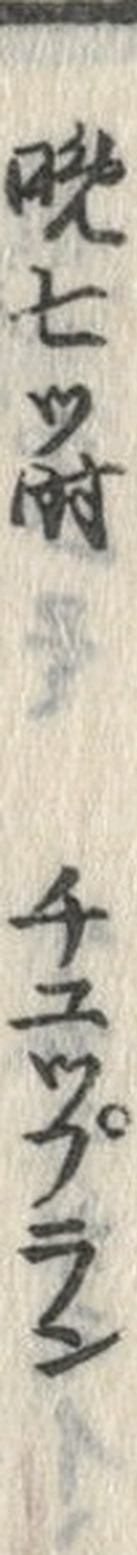昼四ツ時チユツプリイ
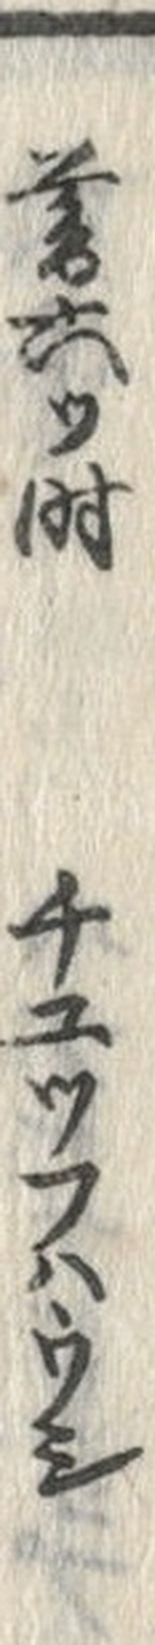暮六ツ時チユツフハウシ
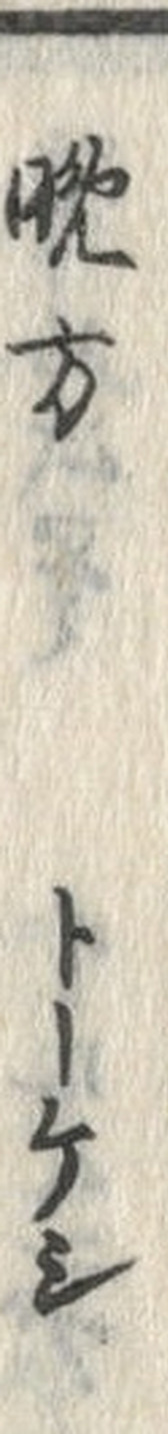晩方トーケシ
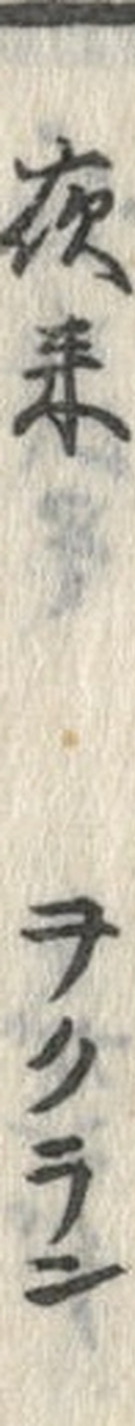夜来ヲクラン
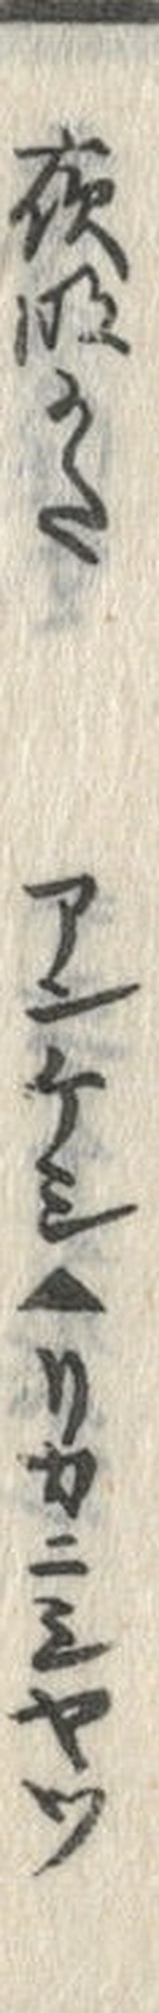夜明かたアンケシ▲リカニシヤツ
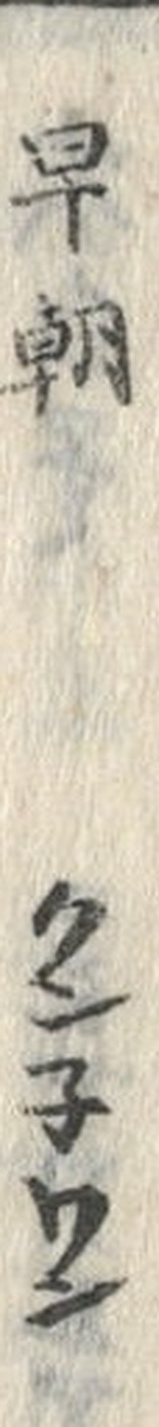早朝クンネワン
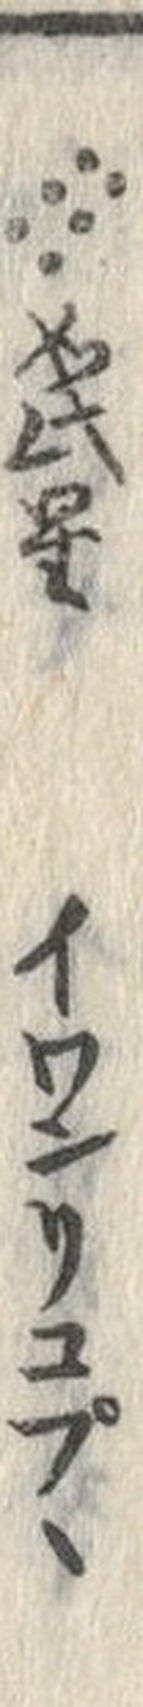∴∵如此星イワンリコプヽ

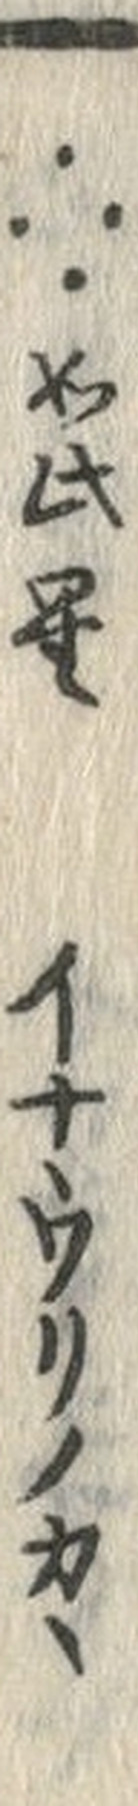∴・如此星イナウリノカヽ
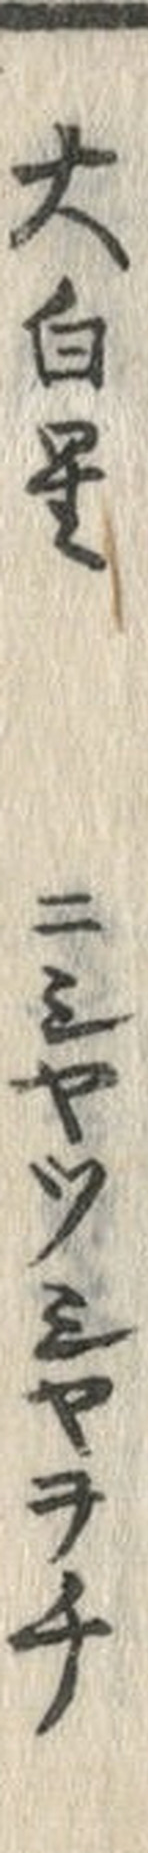大白星ニシヤツシヤヲチ
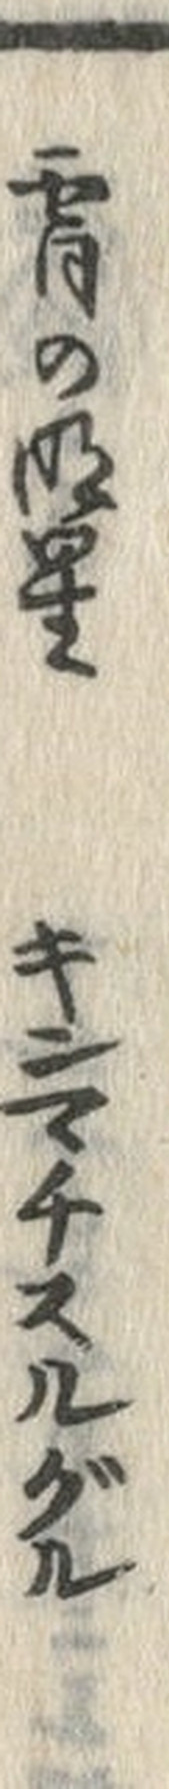宵の明星キンマチスルグル
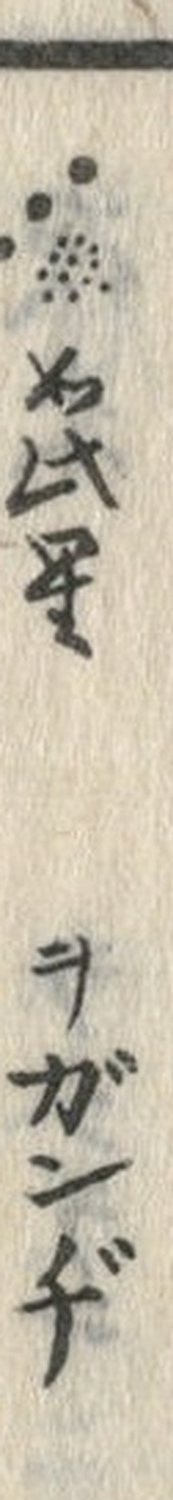如此星ヲガンヂ
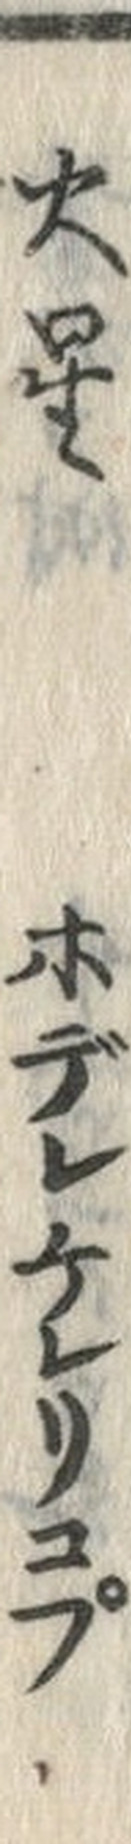火星ホデレケレリコプ
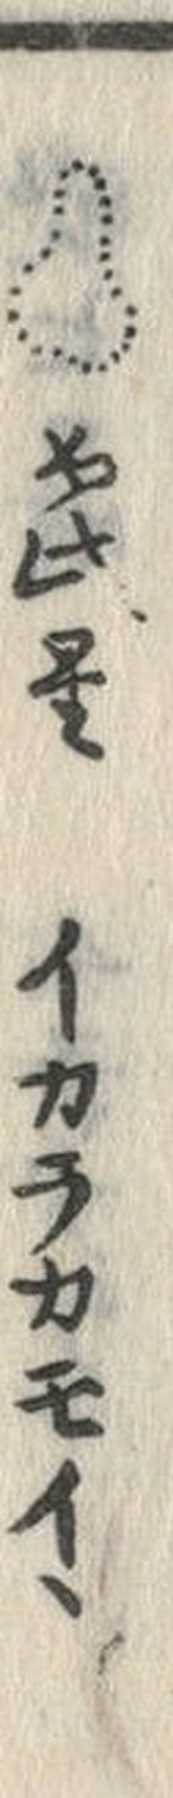如此星イカラカモイヽ
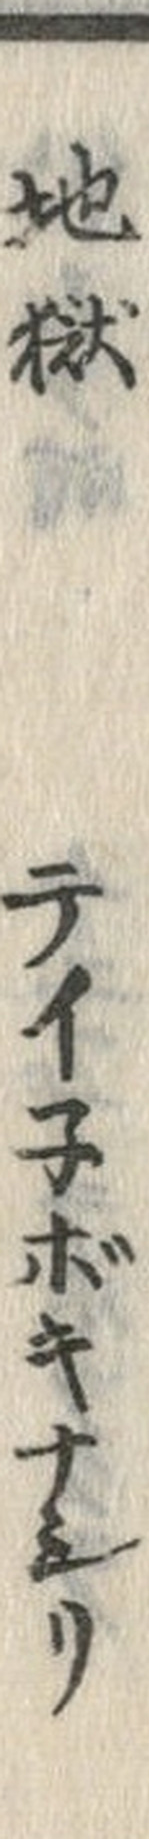地獄テイネボキナシリ
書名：蝦夷方言藻汐草　乾巻
